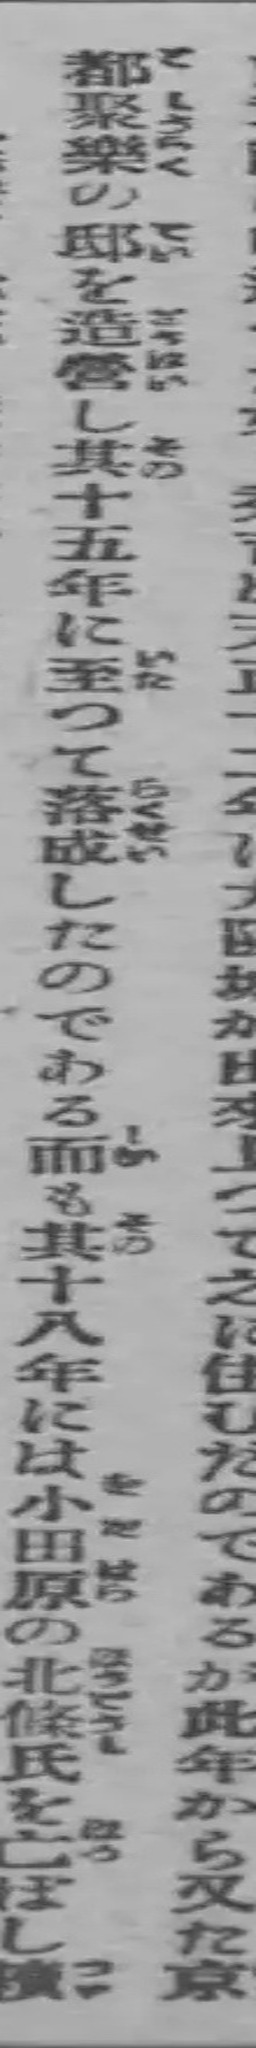都聚楽の邸を造営し其十五年に至つて落成したのである而も其十八年には小田原の北条氏を亡ぼし続
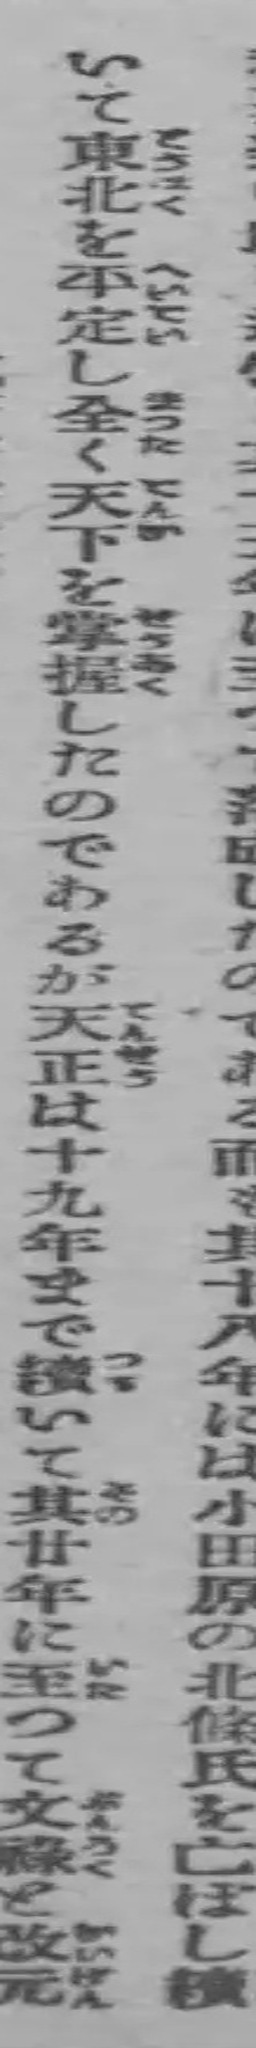いて東北を平定し全く天下を掌握したのであるが天正は十九年まで続いて其廿年に至つて文禄と改元
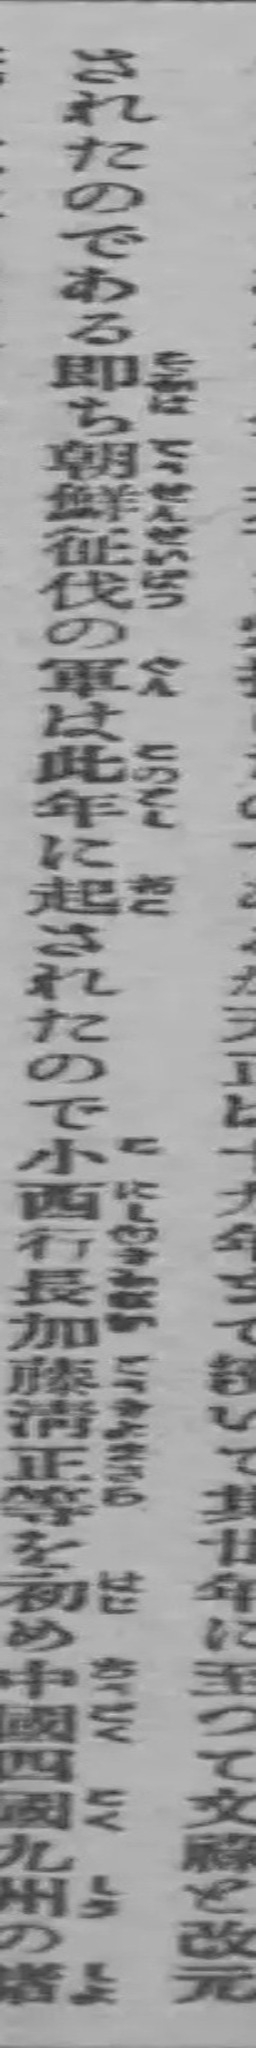されたのである即ち朝鮮征伐の軍は此年に起されたので小西行長加藤清正等を初め中国四国九州の諸
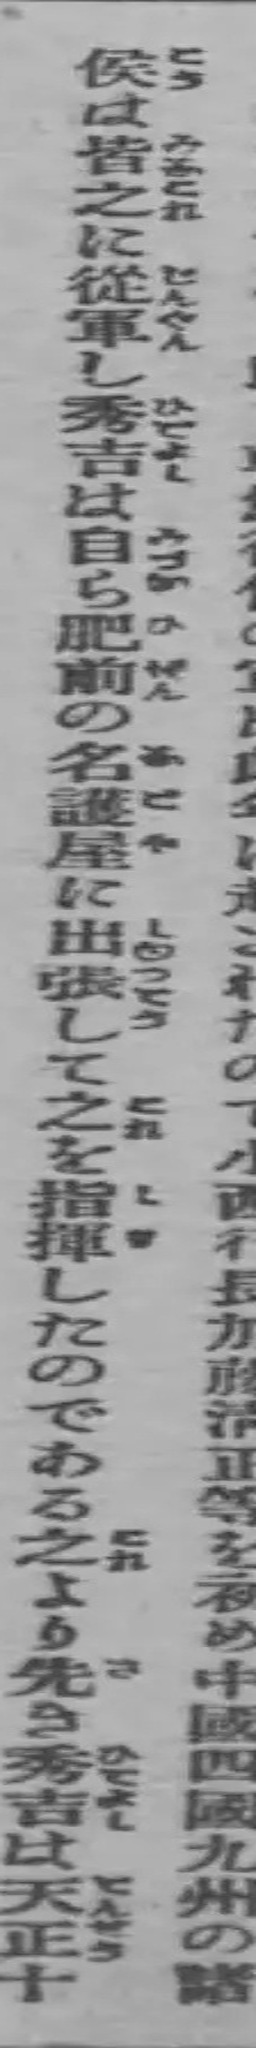候は皆之に従軍し秀吉は自ら肥前の名護屋に出張して之を指揮したのである之より先き秀吉は天正十
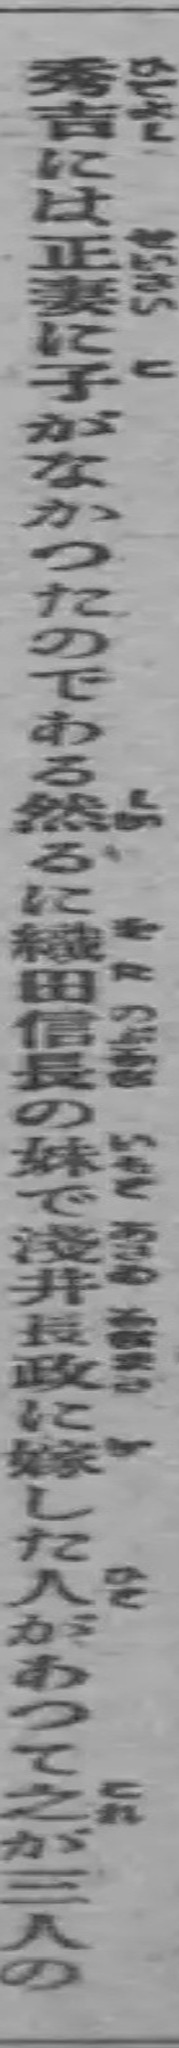秀吉には正妻に子がなかつたのである然るに織田信長の妹で浅井長政に嫁した人があつて之が三人の
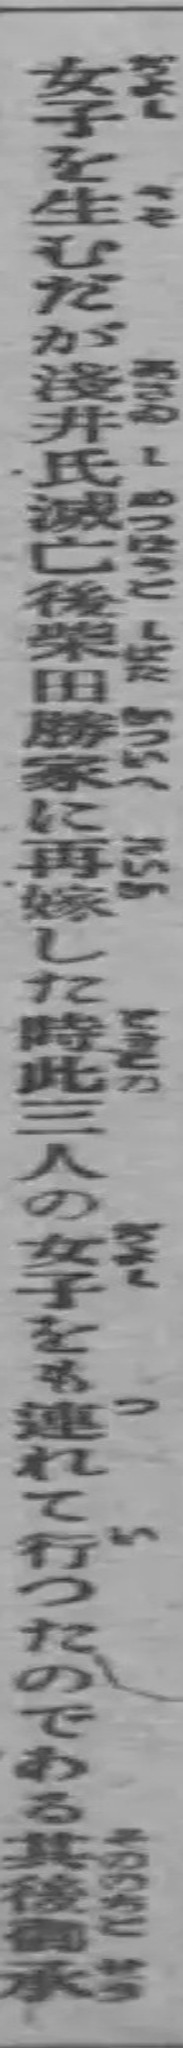女子を生むだが浅井氏滅亡後柴田勝家に再嫁した時此三人の女子をも連れて行つたのである其後御承
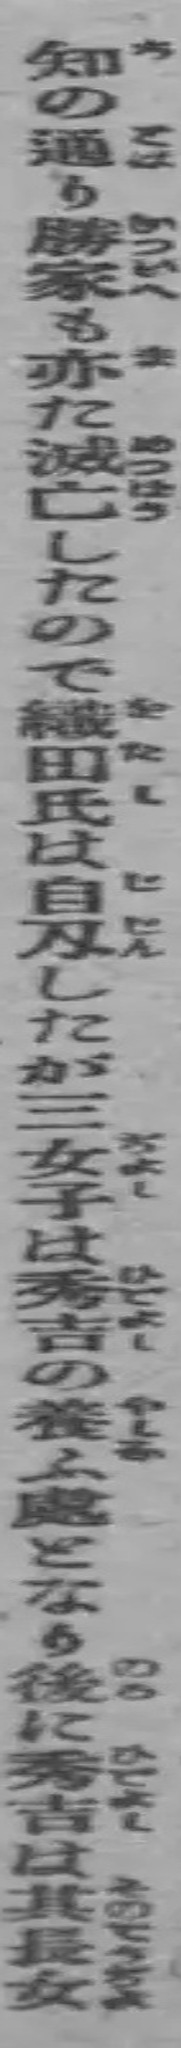知の通り勝家も亦た滅亡したので織田氏は自刃したが三女子は秀吉の養ふ処となり後に秀吉は其長女
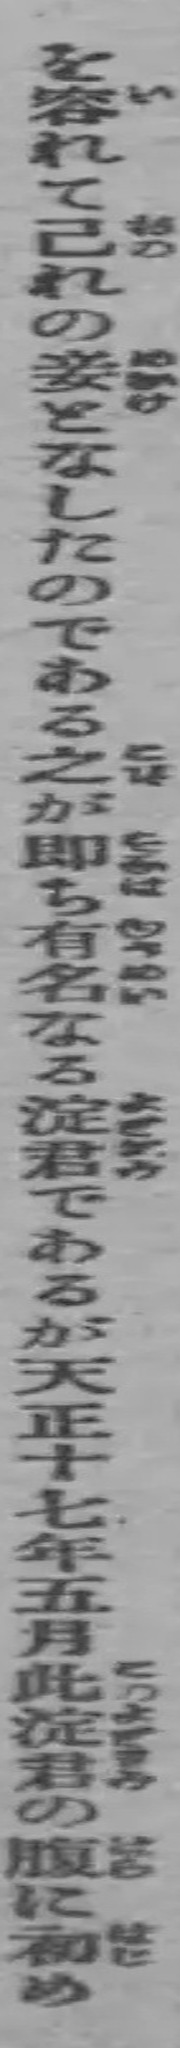淀君を容れて己れの妾となしたのである之が即ち有名なる淀君であるが天正十七年五月此淀君の腹に初め
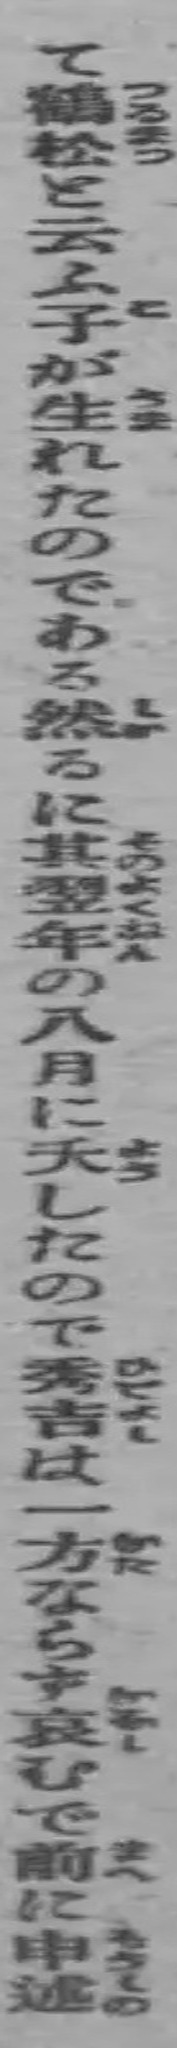て鶴松と云ふ子が生れたのである然るに其翌年の八月に夭したので秀吉は一方ならず哀むで前に申述
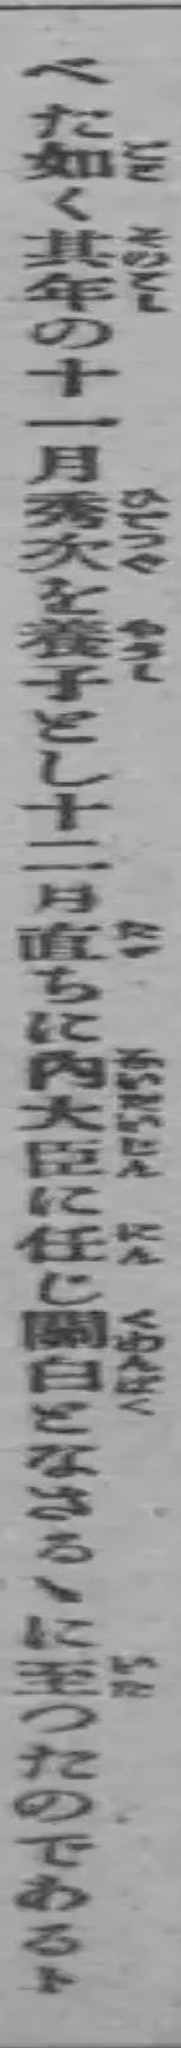べた如く其年の十一月秀次を養子とし十二月直ちに内大臣に任じ関白となさるゝに至つたのであるト
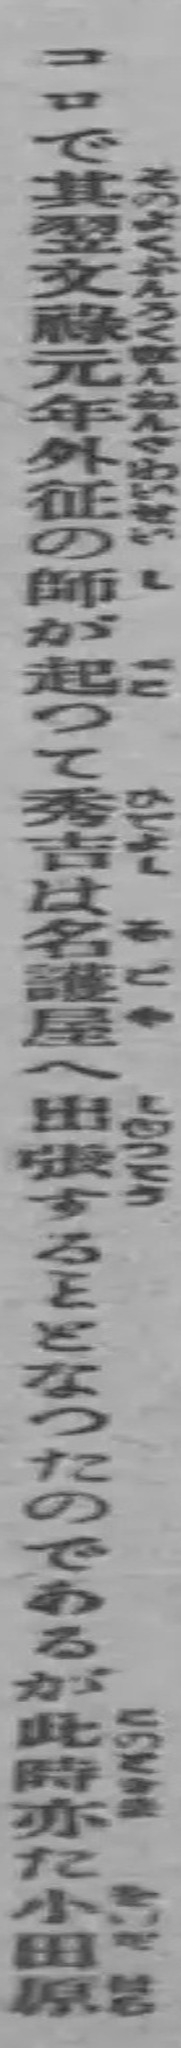コロで其翌文禄元年外征の師が起つて秀吉は名護屋へ出張することとなつたのであるが此時亦た小田原
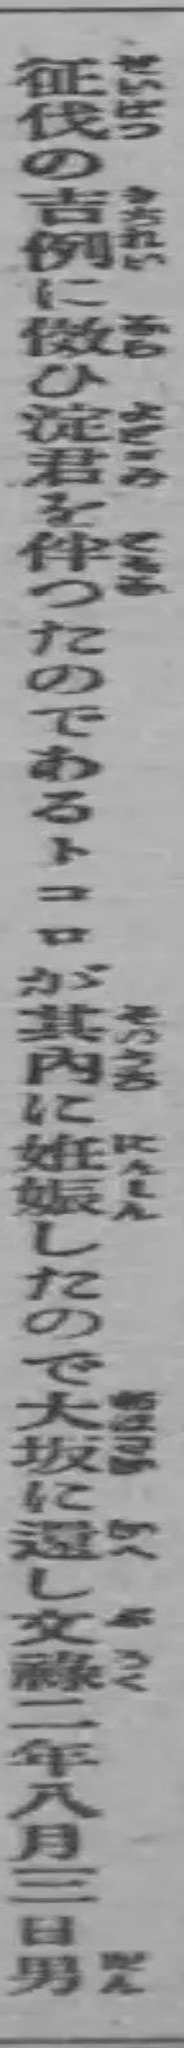征伐の吉例に倣ひ淀君を伴つたのであるトコロが其内に妊娠したので大坂に還し文禄二年八月三日男
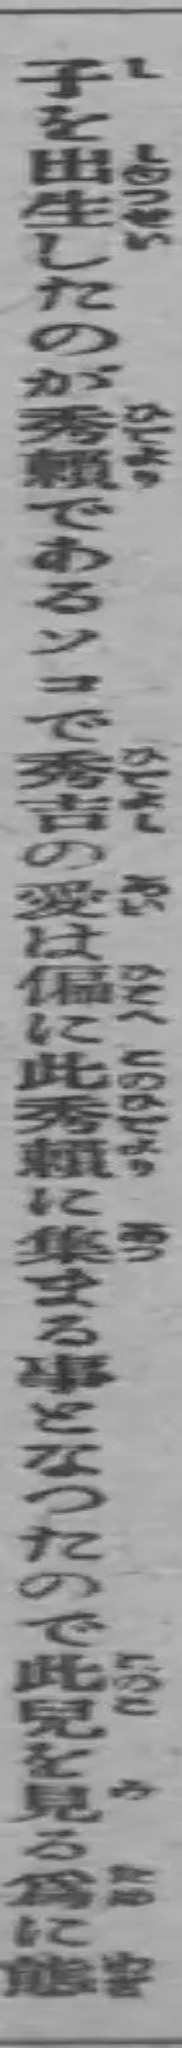秀頼生る子を出生したのが秀頼であるソコで秀吉の愛は偏に此秀頼に集まる事となつたので此児を見る為に態
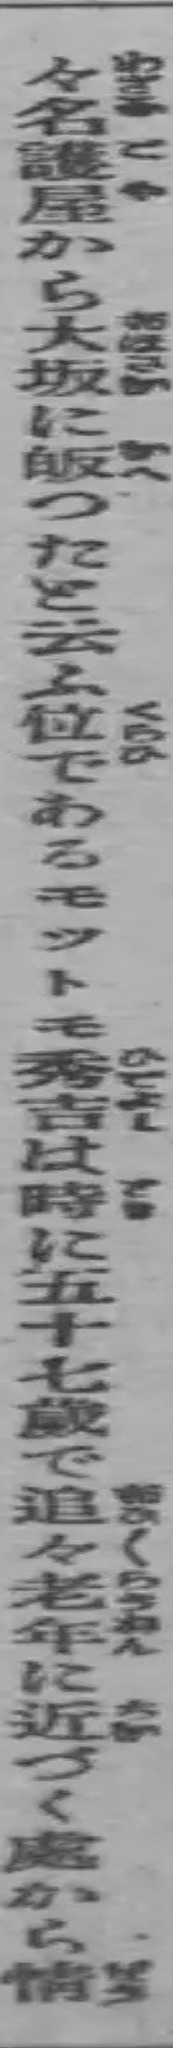態名護屋から大坂に皈つたと云ふ位であるモツトモ秀吉は時に五十七歳で追々老年に近づく処から情
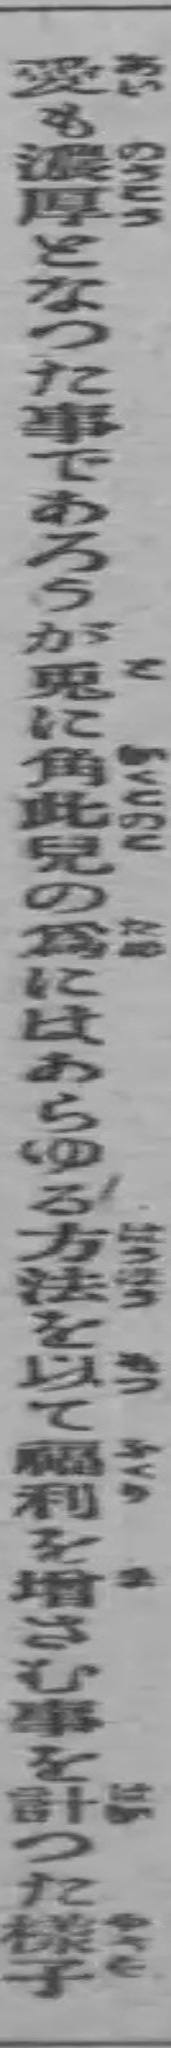愛も濃厚となつた事であろうが兎に角此児の為にはあらゆる方法を以て福利を増さむ事を計つた様子
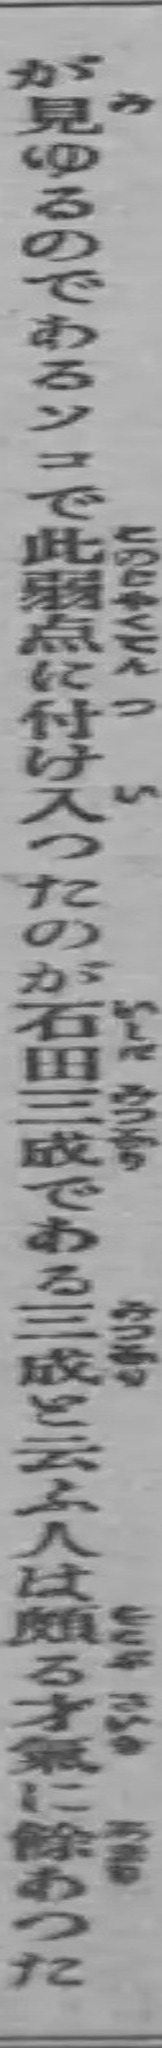石田三成が見ゆるのであるソコで此弱点に付け入つたのが石田三成である三成と云ふ人は頗る才気に余あつた
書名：豊橋市史談
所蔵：国立国会図書館 National Diet Library, JAPAN
